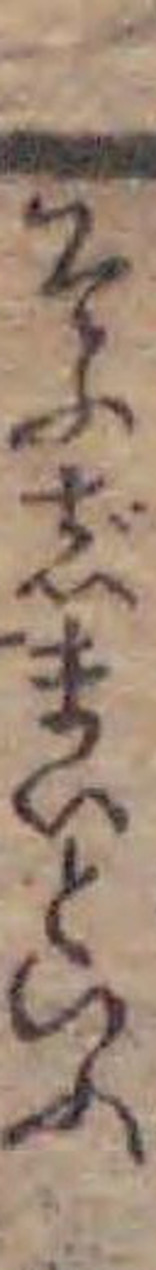そふじまいといふ
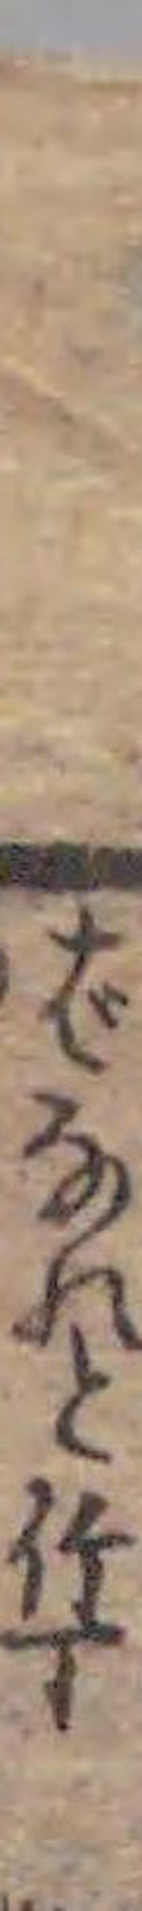ばなれと竹丁
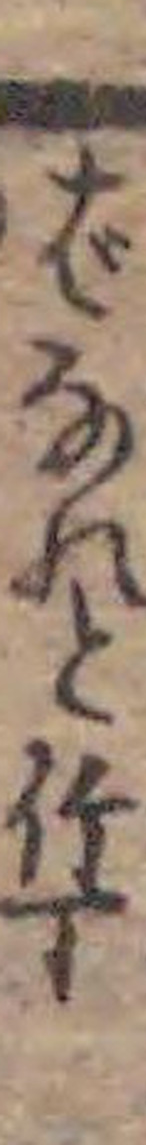ばなれと竹丁
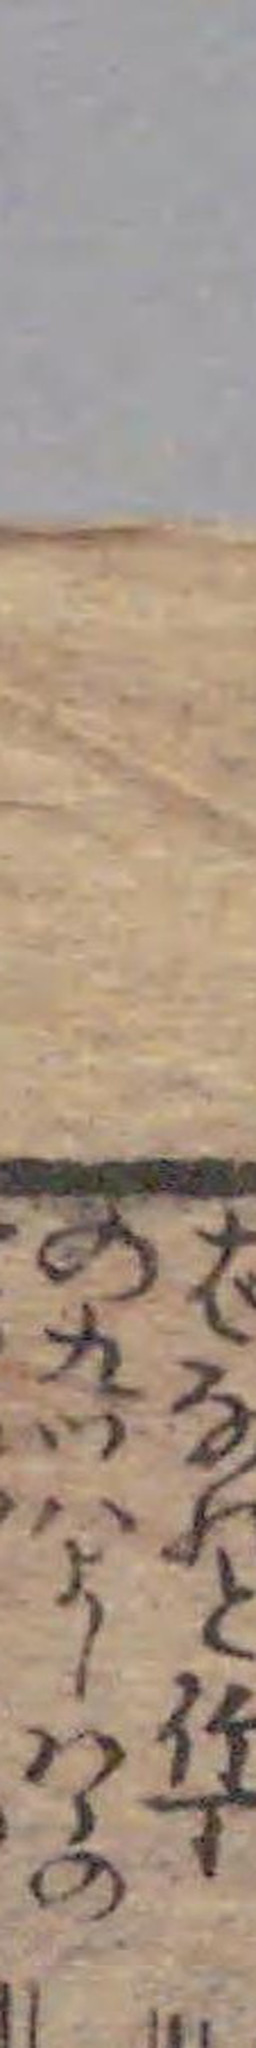の九つはよしはらの
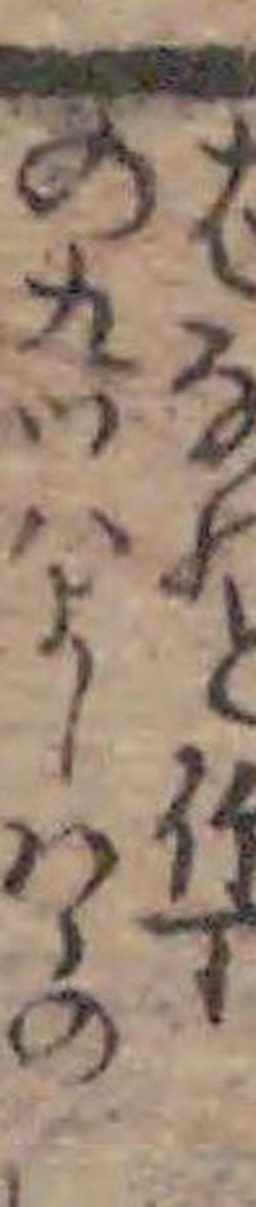の九つはよしはらの
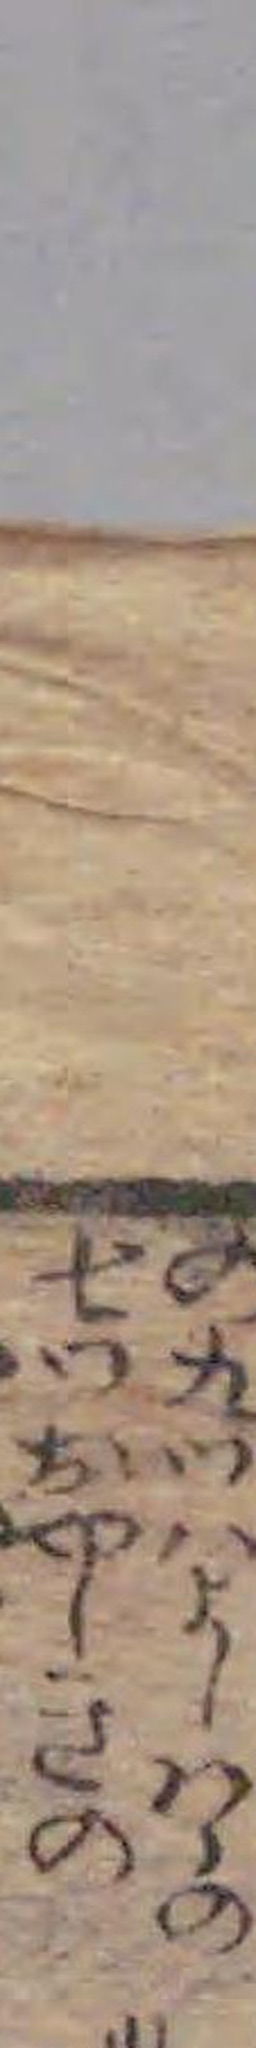七つおやしきの
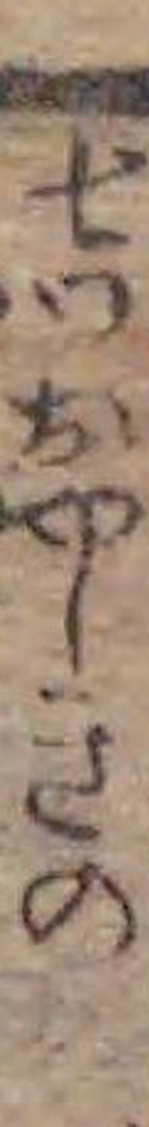七つおやしきの
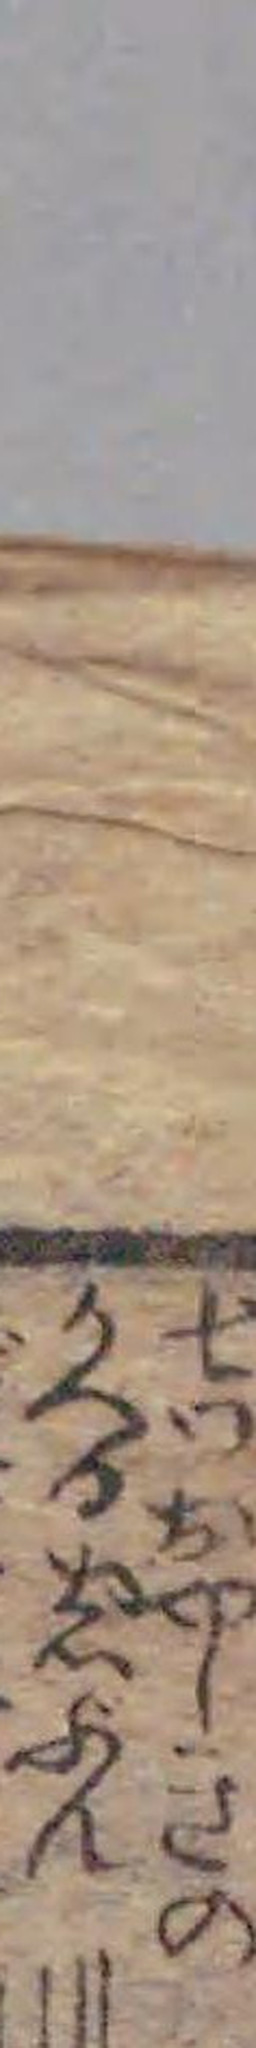かへるしぶん
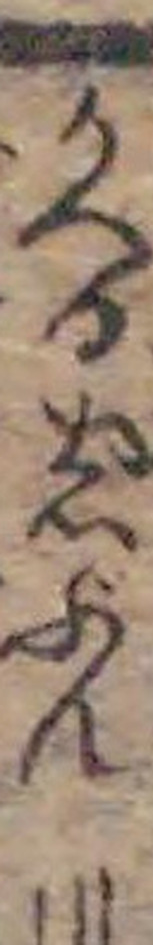かへるしぶん
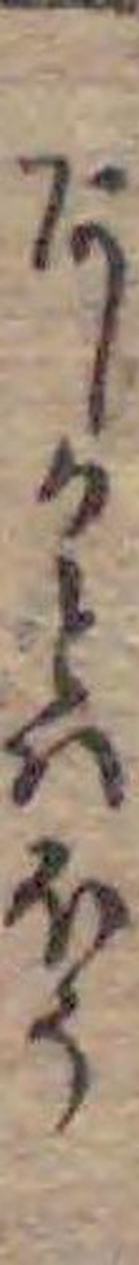あしかとはほう
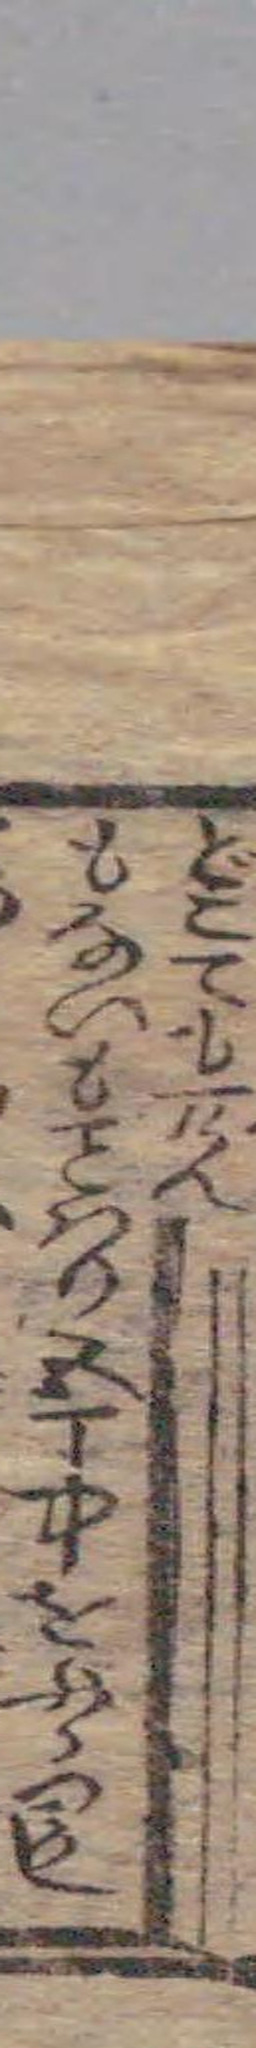もないもことはり五丁中をぶらつし
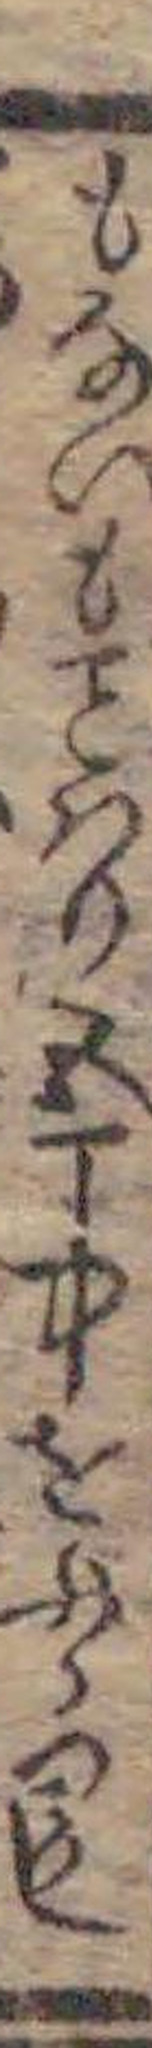もないもことはり五丁中をぶらつし
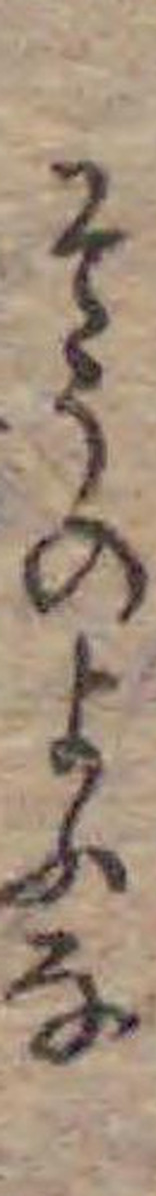そうのよふな
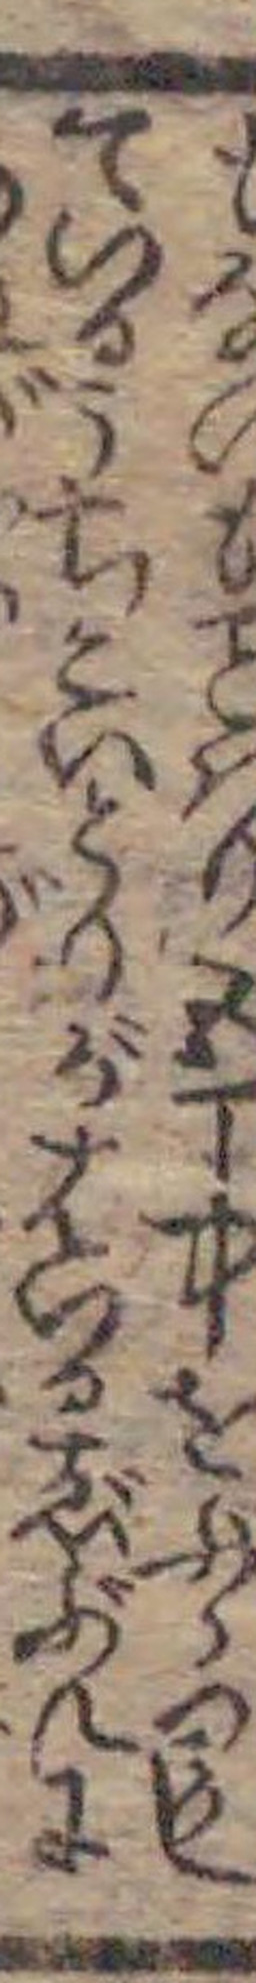ているうちこいとりがはいるじぶんに
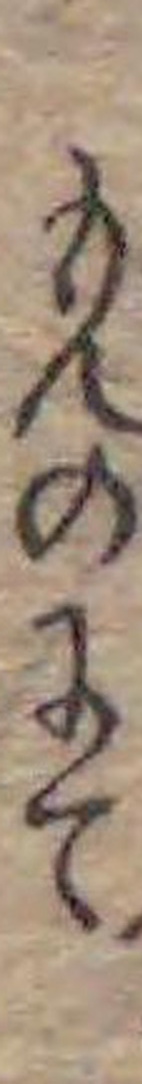もんのにて
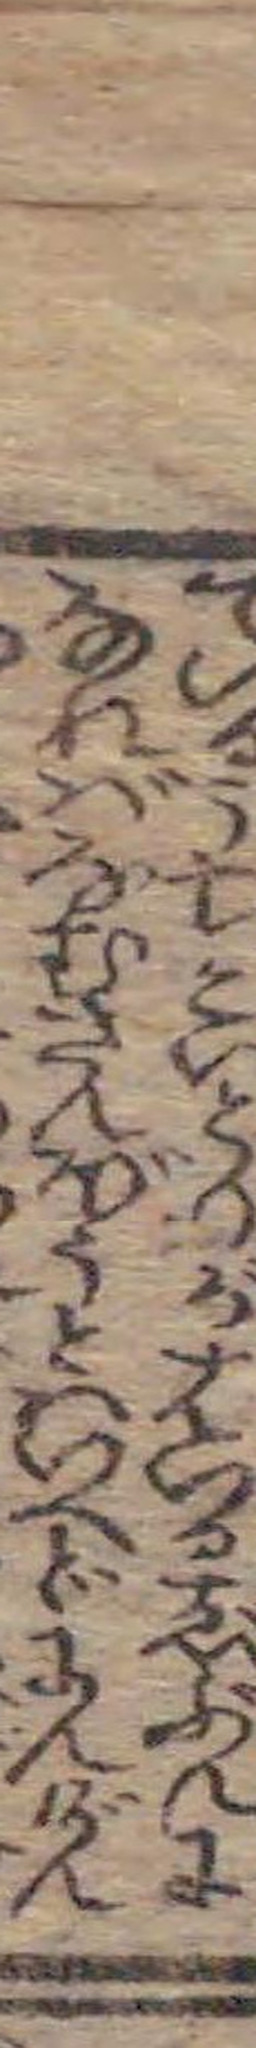なればなむさんぼうといへどにんげん
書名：化物楽屋異牒 : 2巻
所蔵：国立国会図書館 National Diet Library, JAPAN
